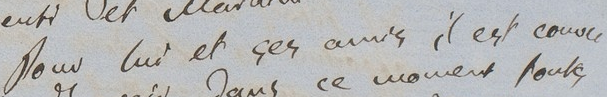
Pour lui et ses amis il est conve-
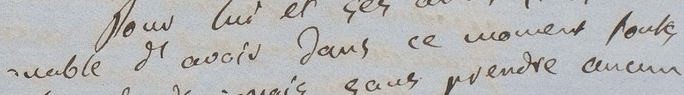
nable d'avoir dans ce moment touts
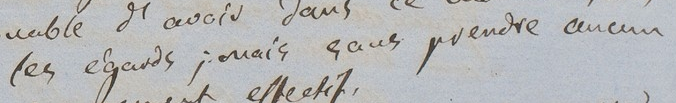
les égards jamais sans prendre aucun
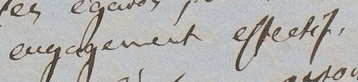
engagement effectif.
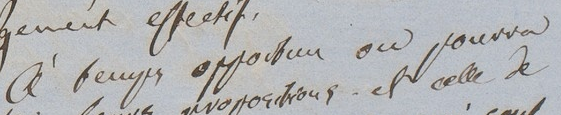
À temps opportun on pourra
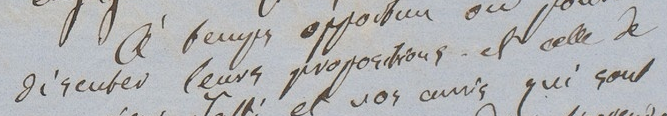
discuter leurs propositions – et celle de
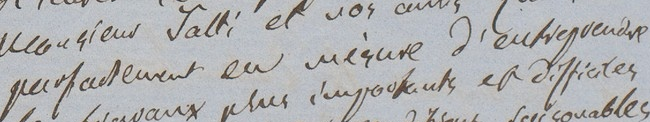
parfaitement en mésure d'entreprendre
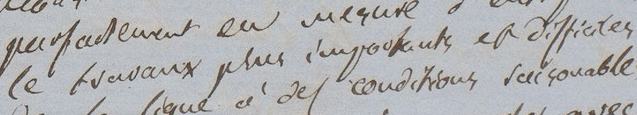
le travaux plus importants et difficiles
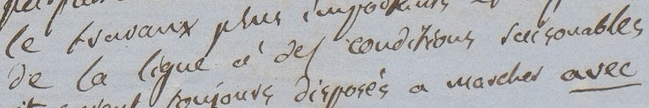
de la ligne à des conditions raisonables
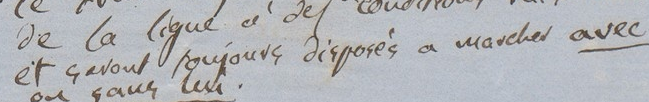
et seront toujours disposés a marcher avec
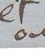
lui.
